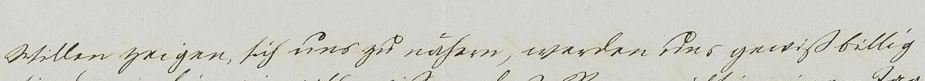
Willen zeigen, sich uns zu nähern, werden uns gewiß billig
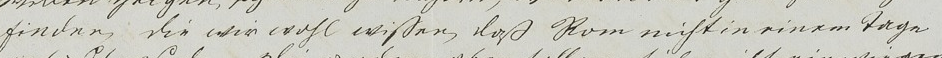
finden, die wir wohl wissen, daß Rom nicht in einem Tage
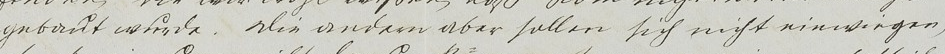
gebaut wurde. Die andern aber sollen sich nicht einwiegen,
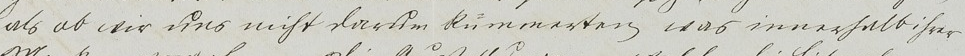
als ob wir uns nicht darum kümmerten, was innerhalb ihrer
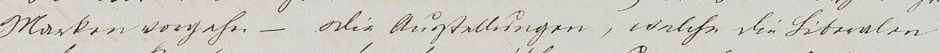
Marken vorgehe. – Die Ausstellungen, welche die Liberalen
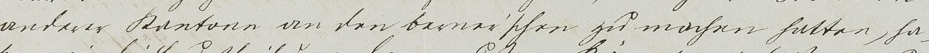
anderer Kantone an den berner'schen zu machen hatten, ha-
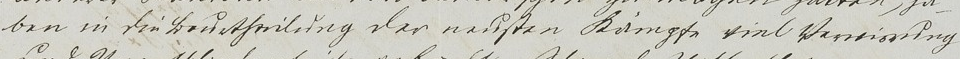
ben in die Beurtheilung der neusten Kämpfe viel Verwirrung
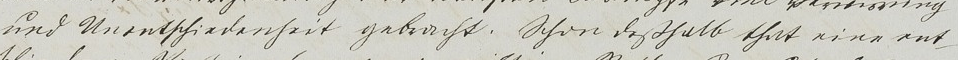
und Unentschiedenheit gebracht. Schon deßhalb that eine ent-
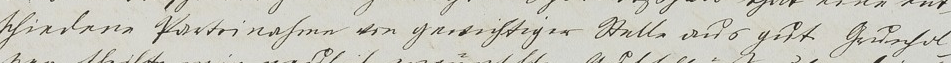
schiedene Parteinahme von gewichtiger Stelle aus gut. Grunhol-
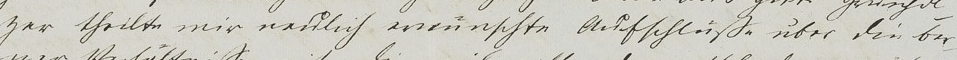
zer theilte mir neulich erwünschte Aufschlüsse über die ber-
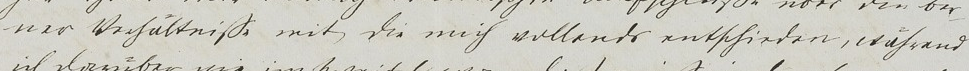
ner Verhältnisse mit, die mich vollends entschieden, während
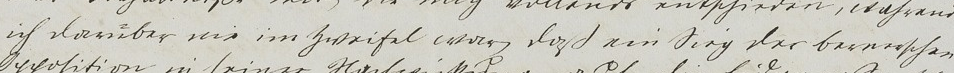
ich darüber nie im Zweifel war, daß ein Sieg der bernerschen
